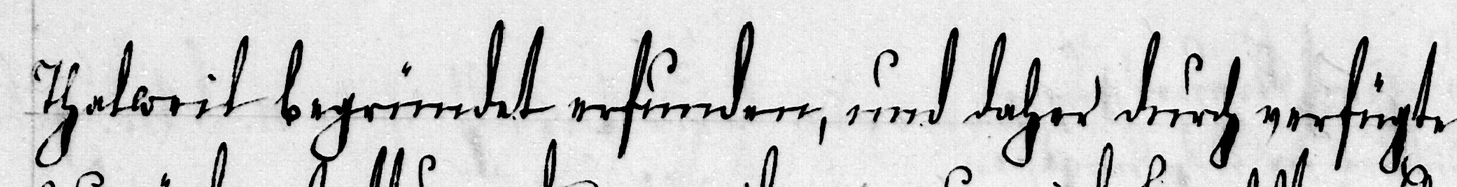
Thalweil begründet erfunden, und daher durch verfügte
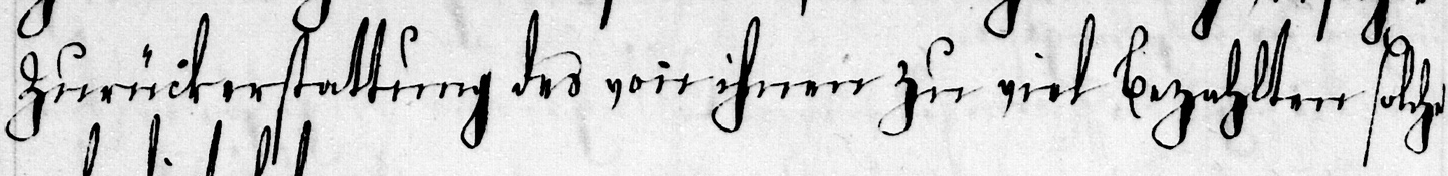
Zurückerstattung des von ihnen zu viel bezahlten solche
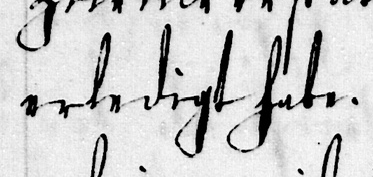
erledigt habe.
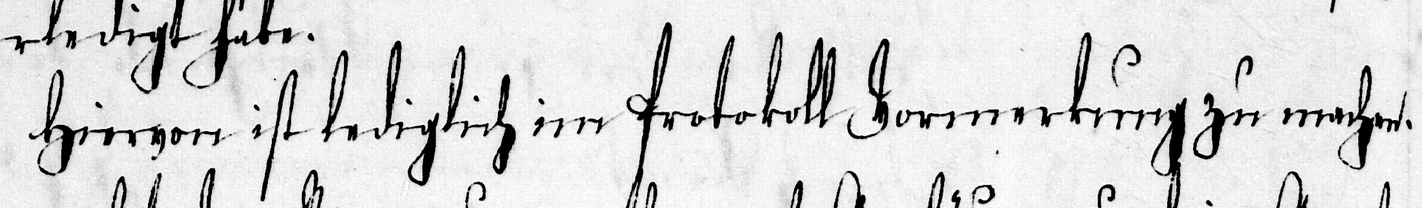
Hiervon ist lediglich im Protokoll Vormerkung zu mache¬
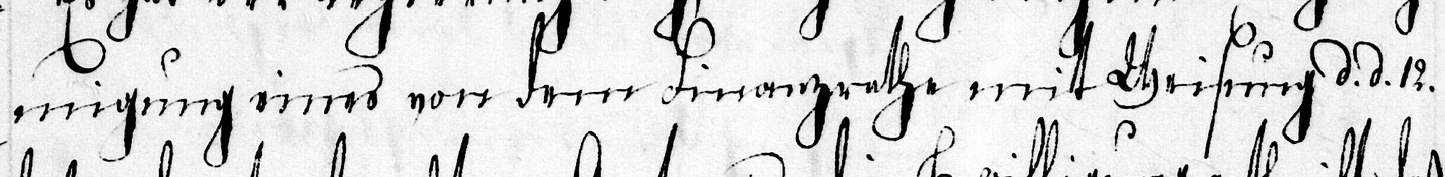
migung eines von dem Finanzrathe mit Weisung d. d. 12.
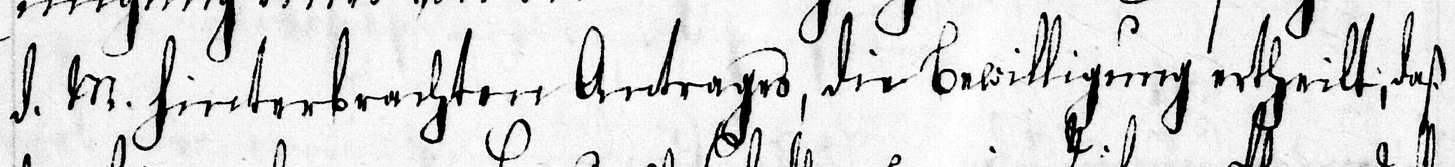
d. M. hinterbrachten Antrages, die Bewilligung ertheilt, daß
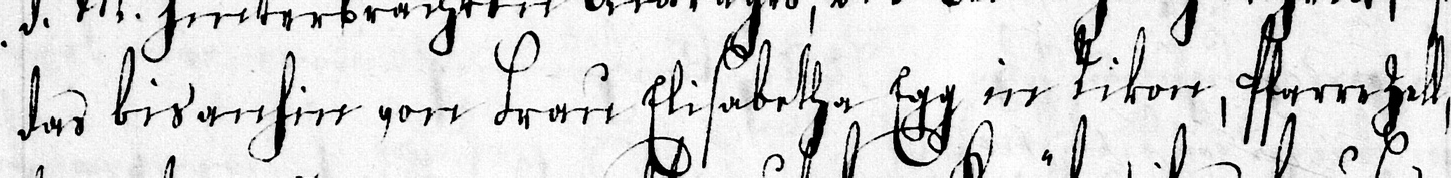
das bis anhin von Frau Elisabetha Egg in Rikon Pfarre Zel¬
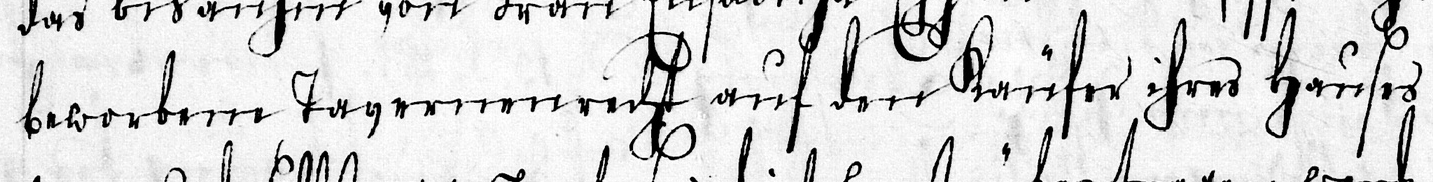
beworbene Tavernenrecht auf den Käufer ihres Hauses
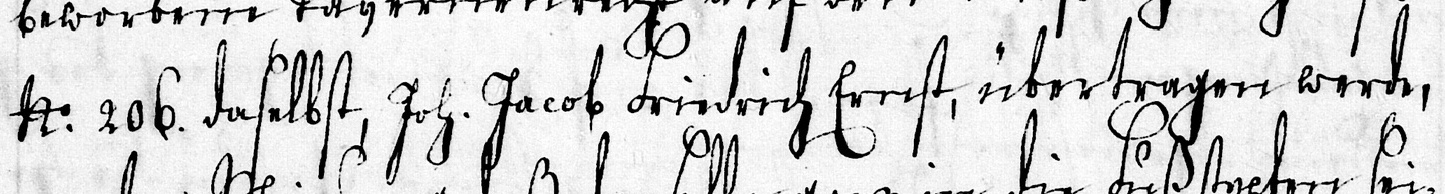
No. 206. daselbst, Joh. Jacob Friedrich Ernst, übertragen werde,
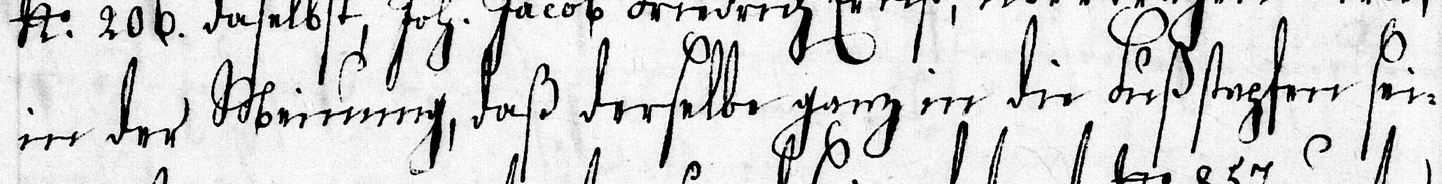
in der Meinung, daß derselbe ganz in die Fußstapfen sei¬
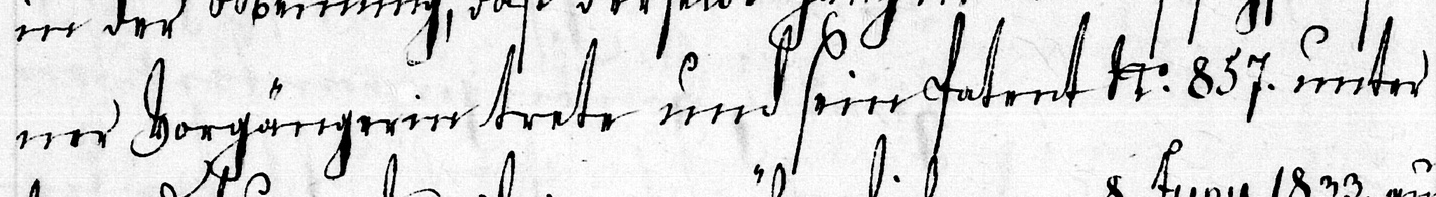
ner Vorgängerin trete und sein Patent No. 857. unter
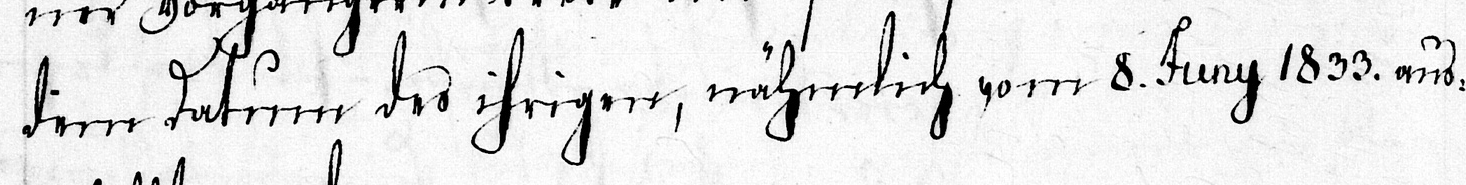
dem Datum des ihrigen, nähmlich vom 8. Juny 1833. aus¬
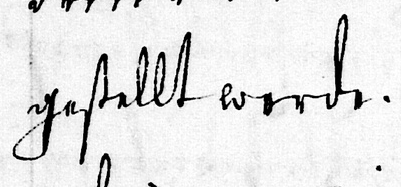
gestellt werde.
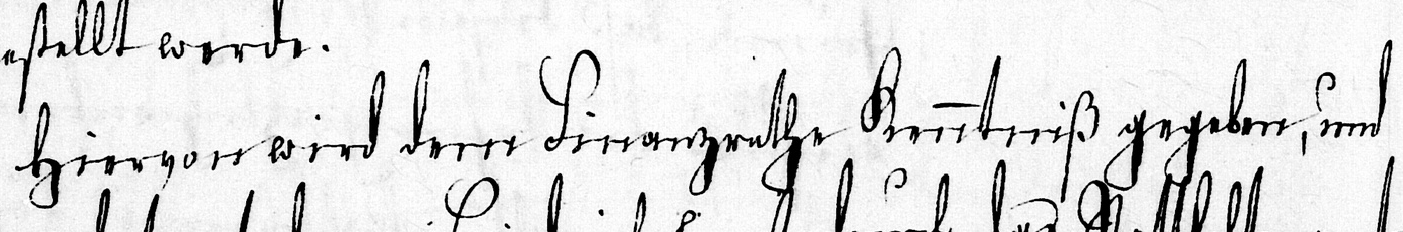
Hiervon wird dem Finanzrathe Kenntniß gegeben, und
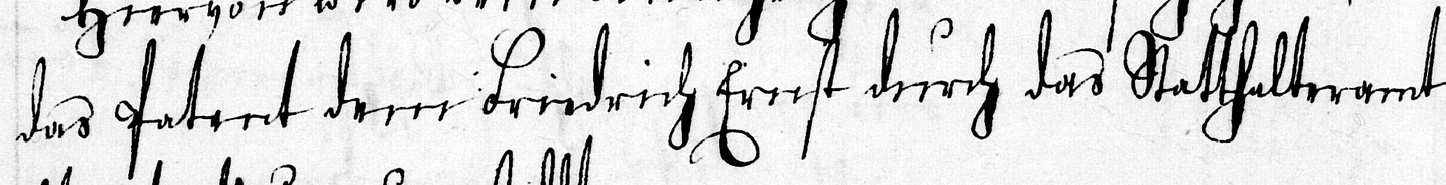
das Patent dem Friedrich Ernst durch das Statthalteramt
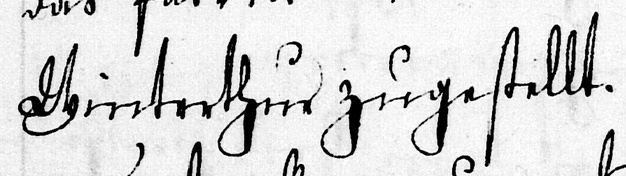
Winterthur zugestellt.
